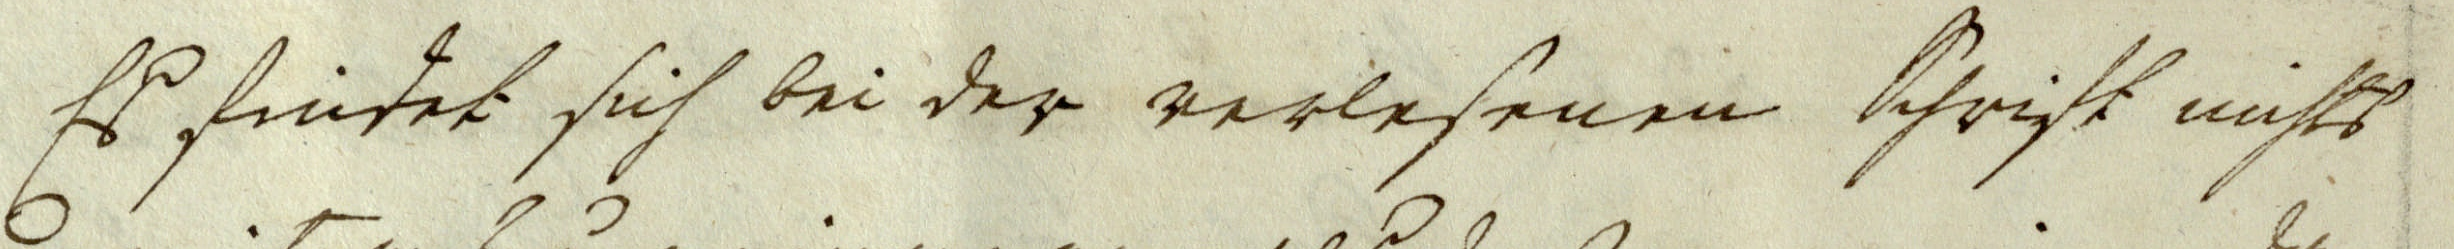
Es findet sich bei der verlesenen Schrift nichts
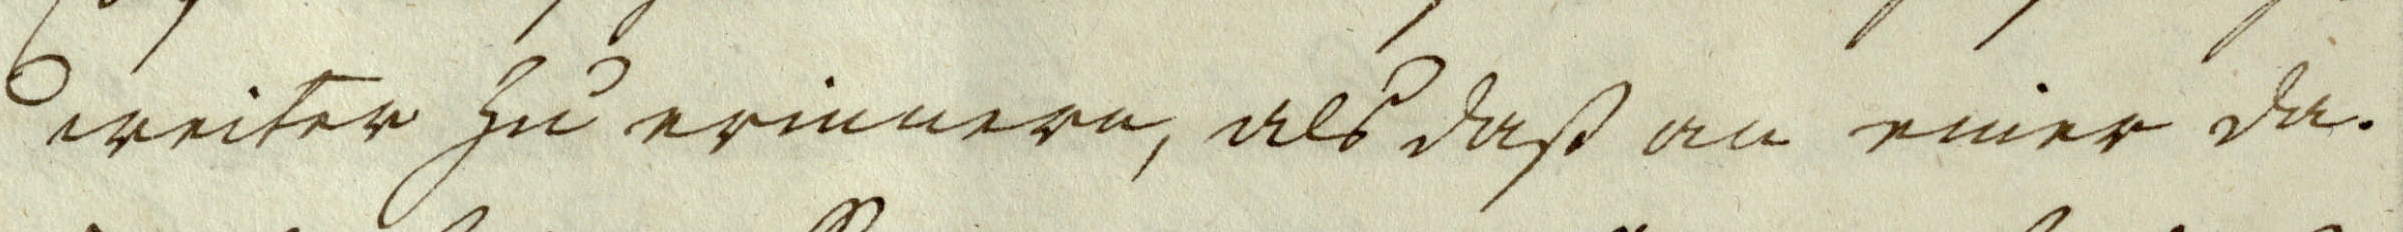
weiter zu erinnern, als daß an einer da¬
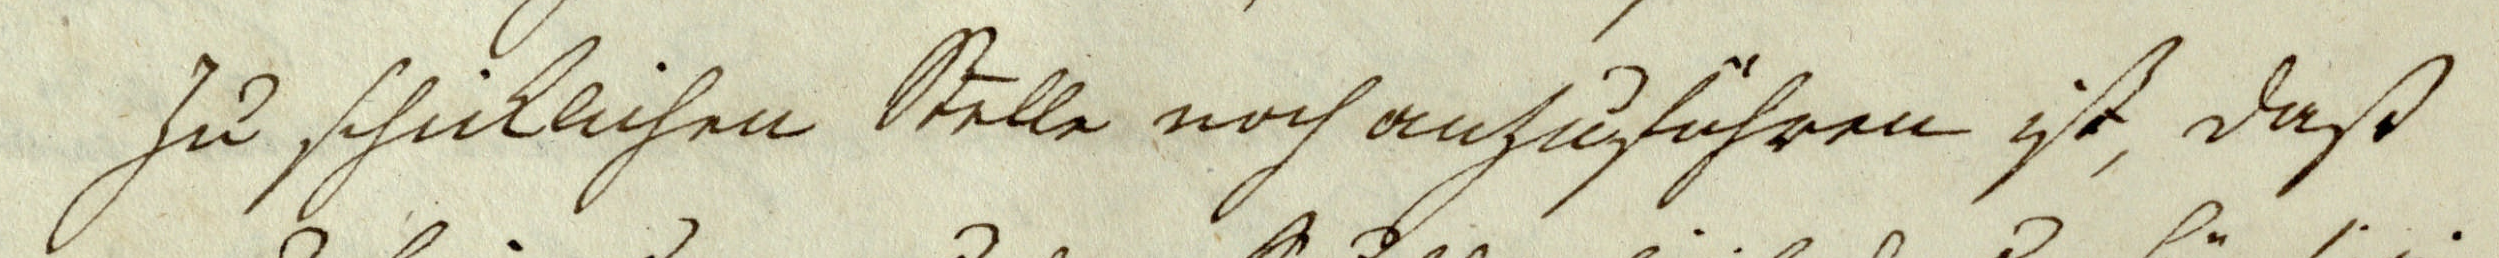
zu schicklichen Stelle noch anzuführen ist, daß
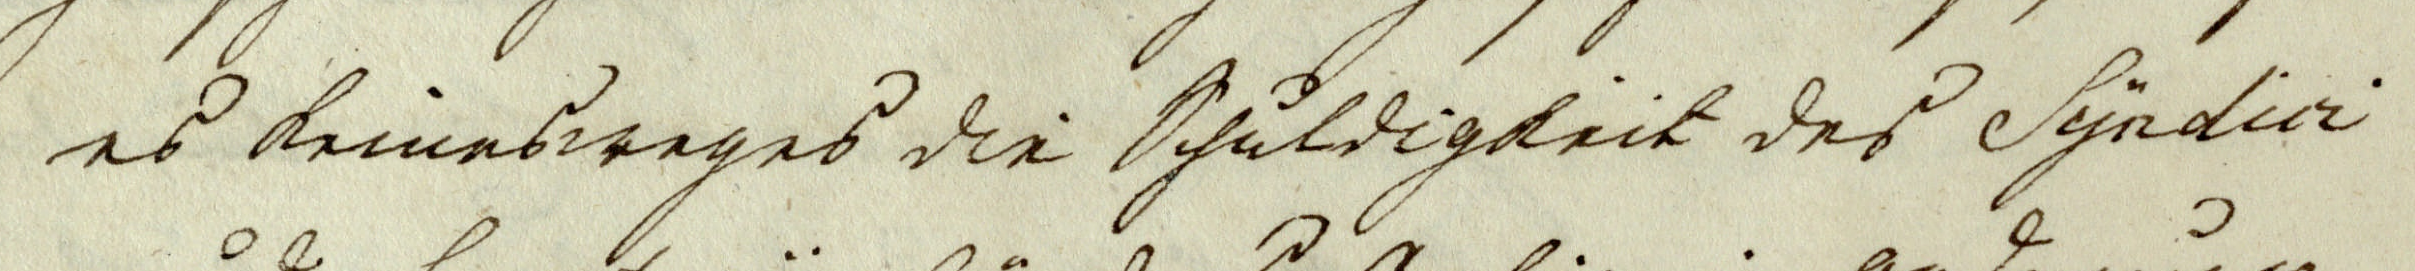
es keinesweges die Schuldigkeit des Sÿndici
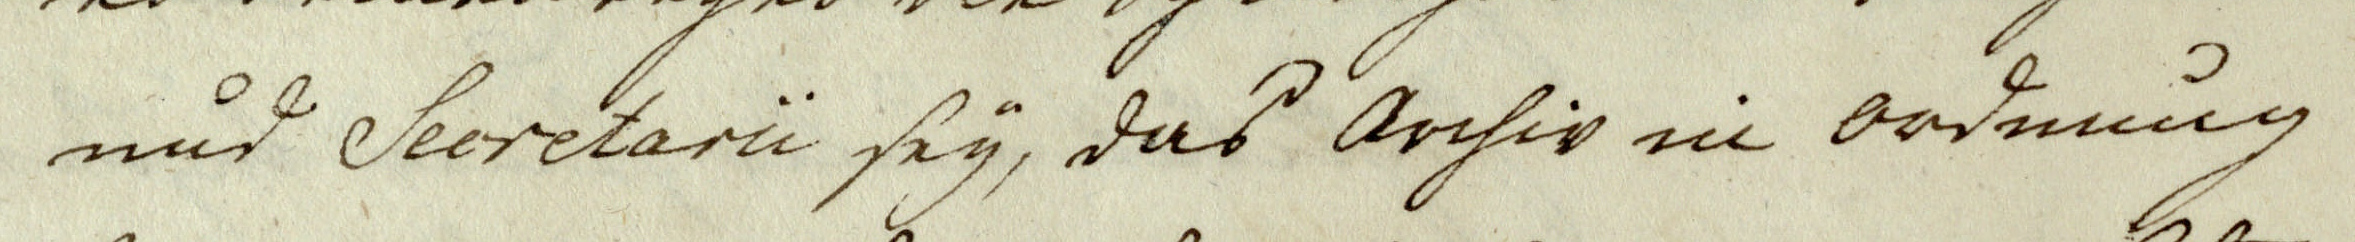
und Secretarii seÿ, das Archiv in Ordnung
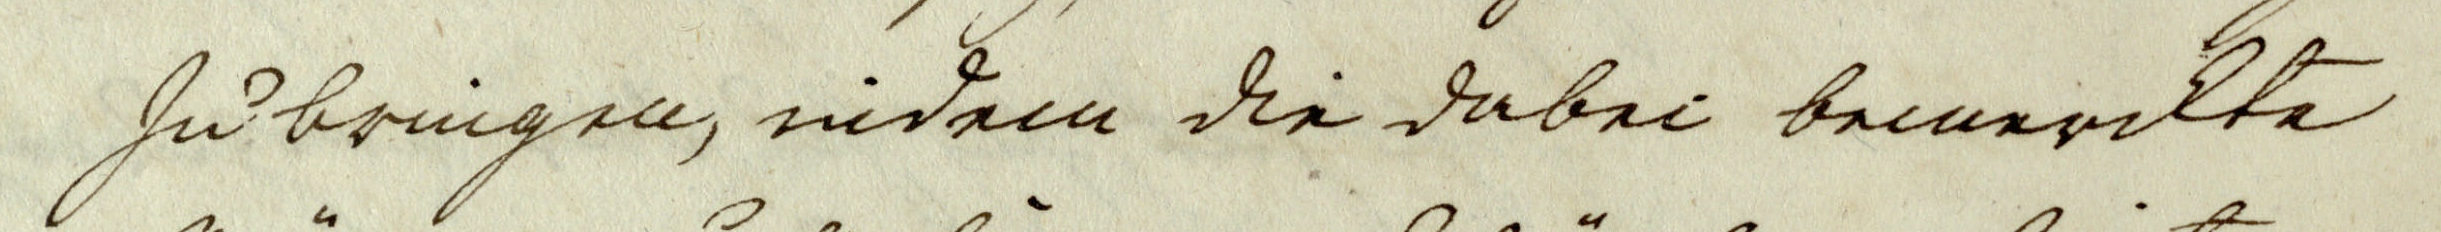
zu bringen, indem die dabei bemerckten
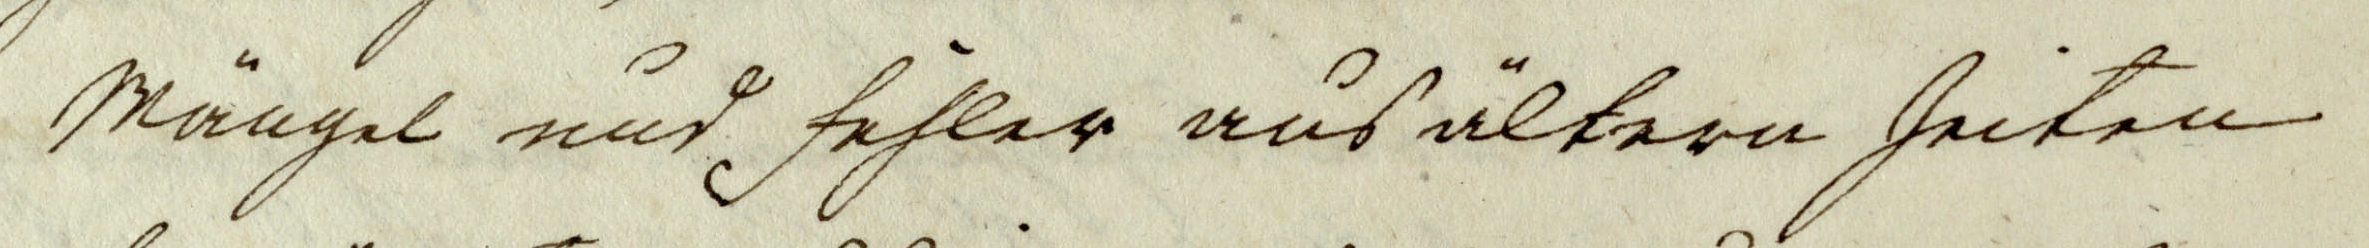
Mängel und Fehler aus ältern Zeiten
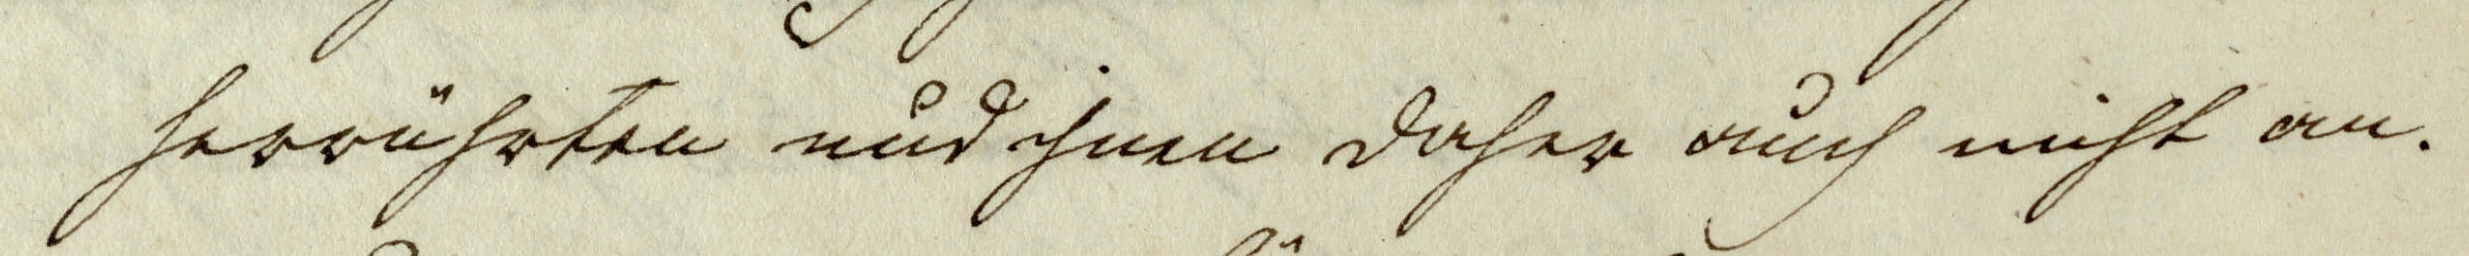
herrührten und ihnen daher auch nicht an¬
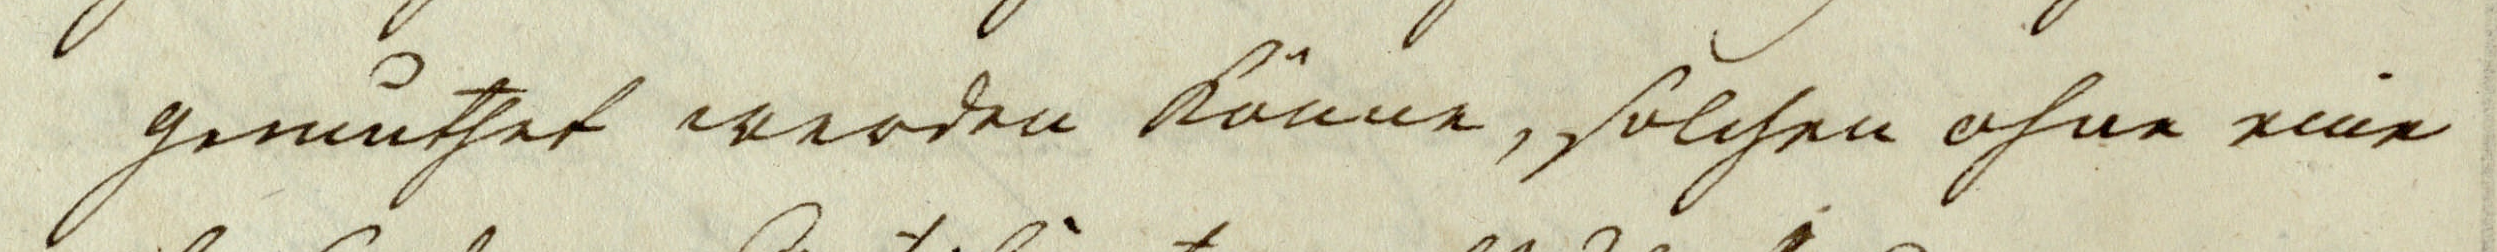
gemuthet werden könne, solchen ohne eine
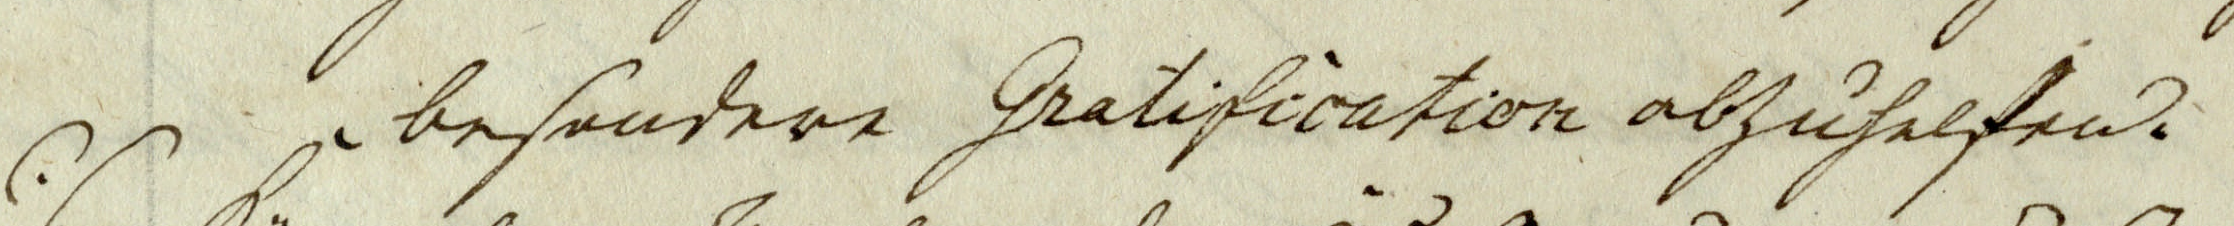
besondere Gratification abzuhelfen.
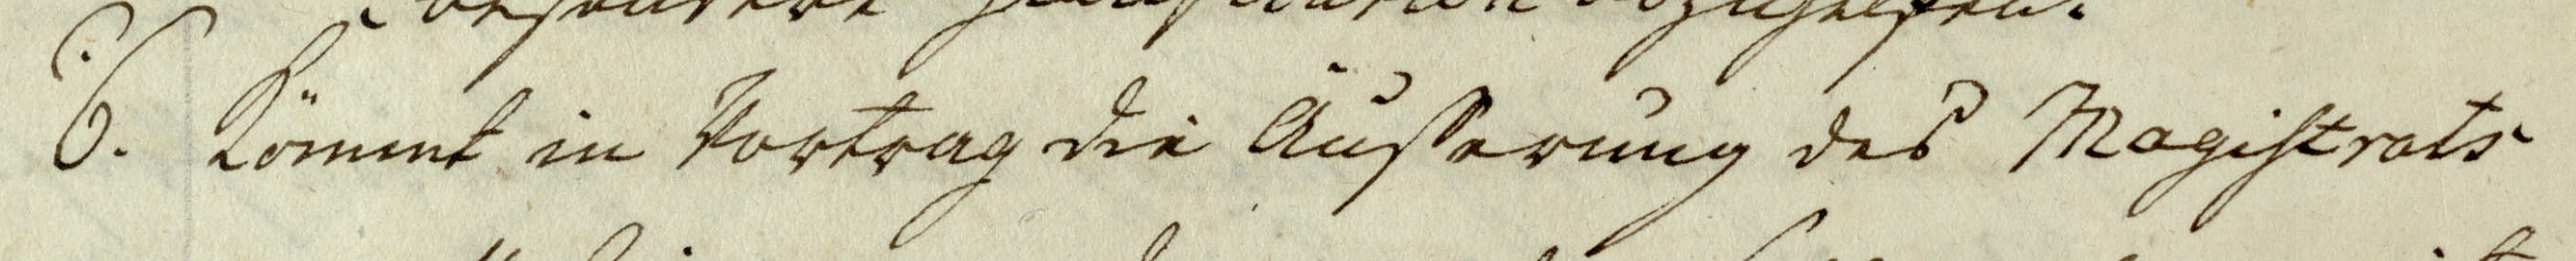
6. Kömmt in Vortrag die Äusserung des Magistrats
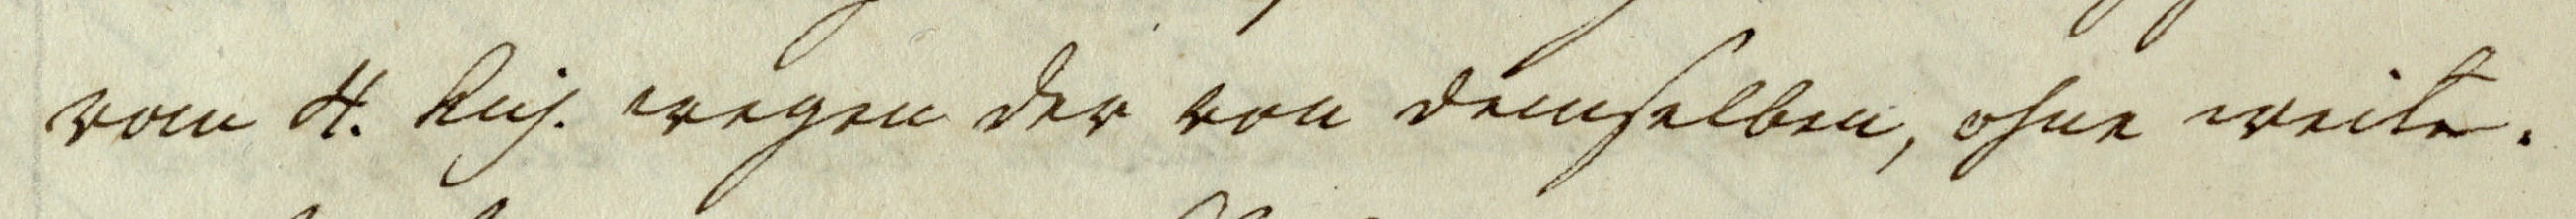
vom 4. huj. wegen der von demselben, ohne weite¬
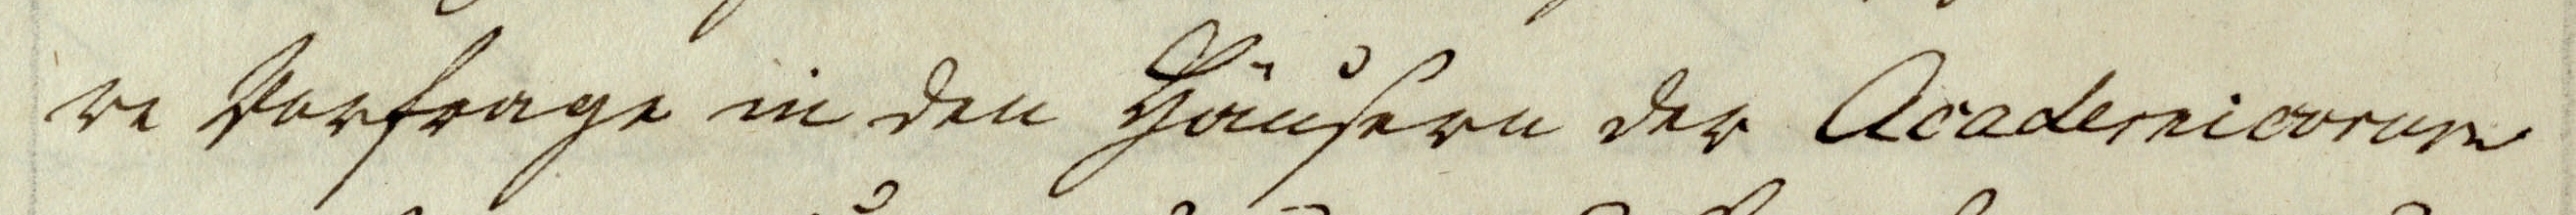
re Vorfrage in den Häusern der Academicorum
